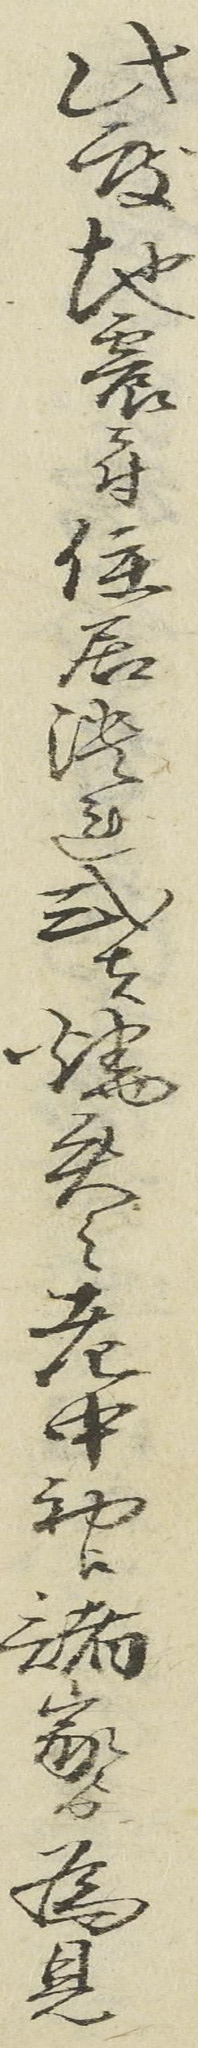此度地震二付住居潰れ或は焼失に老中初ゟ諸家ゟ為見

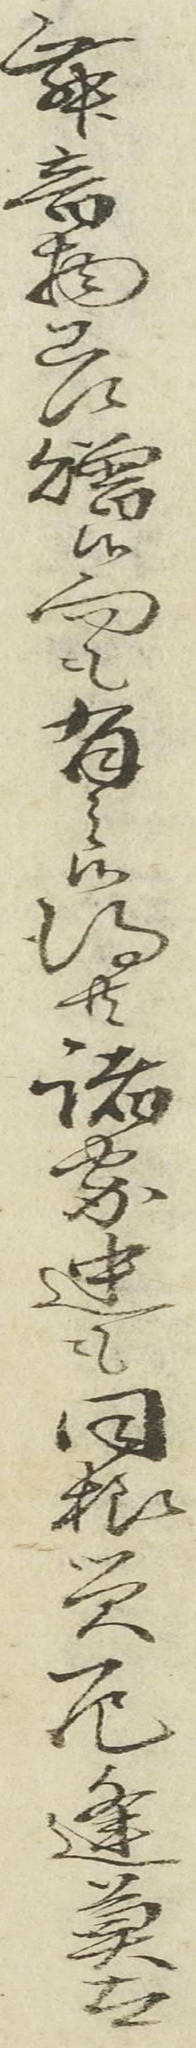舞音物差贈候向きも有之候得共諸家迚も同様災厄逢寞太
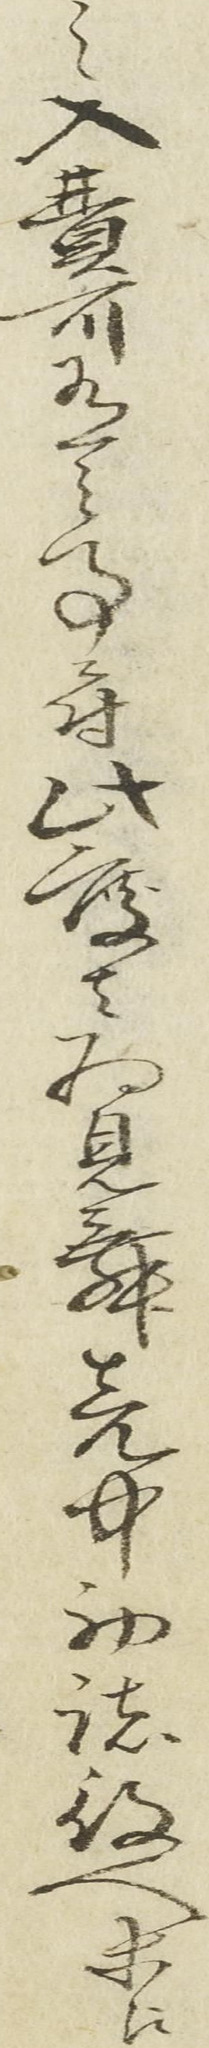之入費可有之事に付此度は為見舞老中初諸役人等え
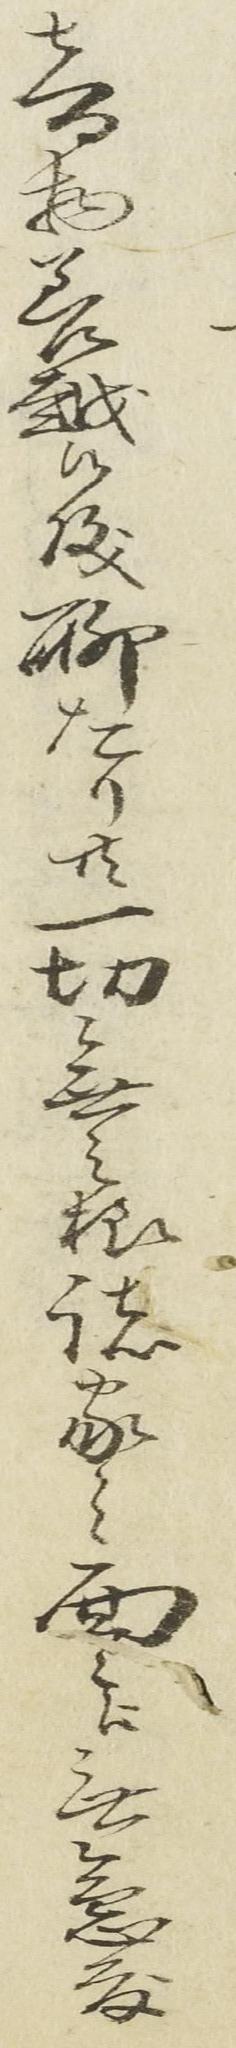音物差越候儀聊たり共一切無之様諸家之面々え無急度
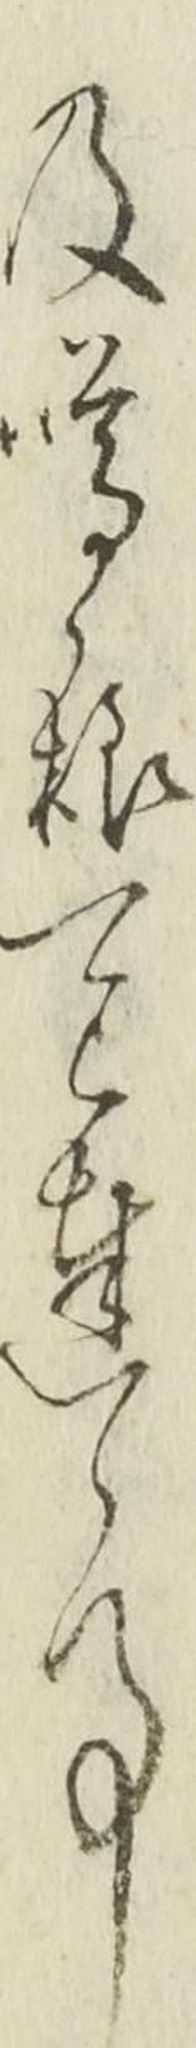及噂候様可被達候事
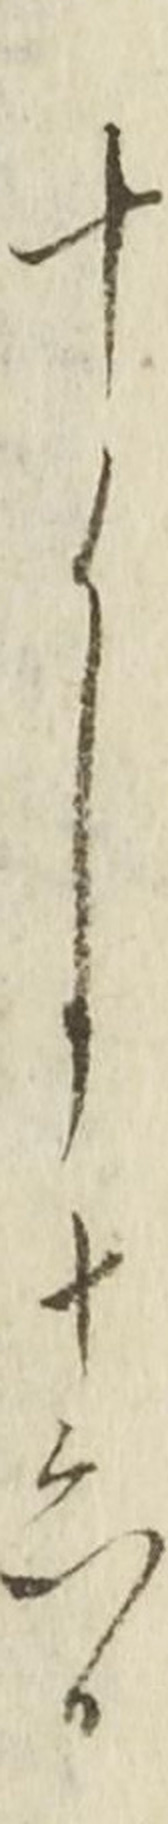十月十六日
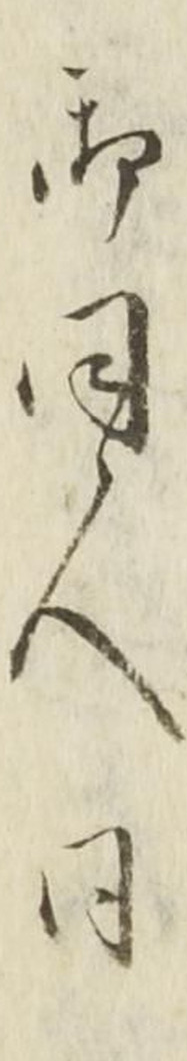御同人同
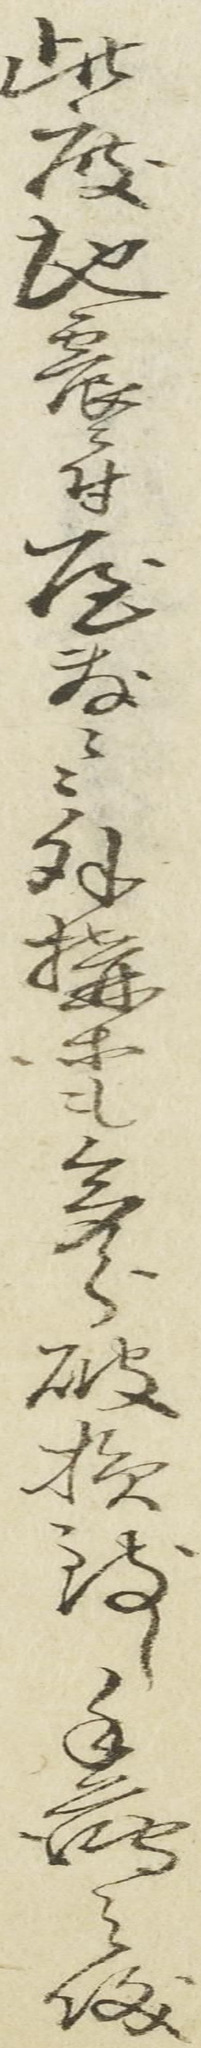此度地震二付屋敷々々外構等も多分破損致手薄之儀
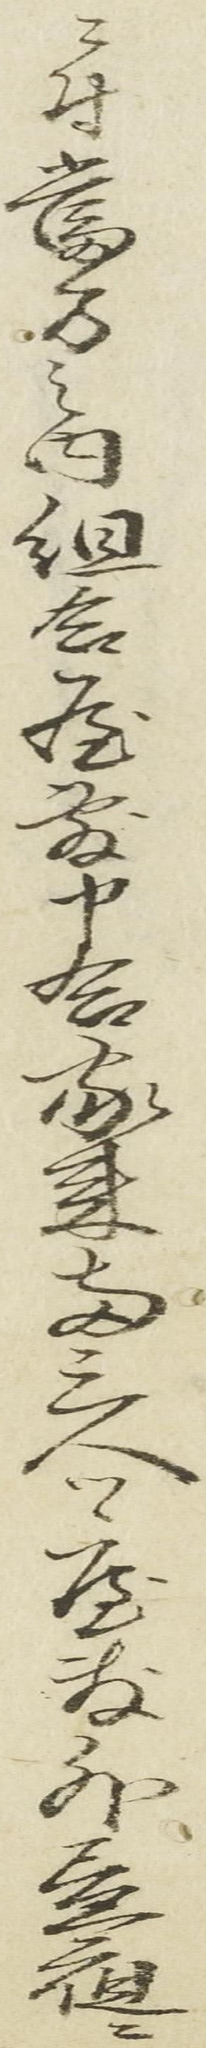二付当方之内組合屋敷申合家来両三人ヅゝ屋敷外昼夜二
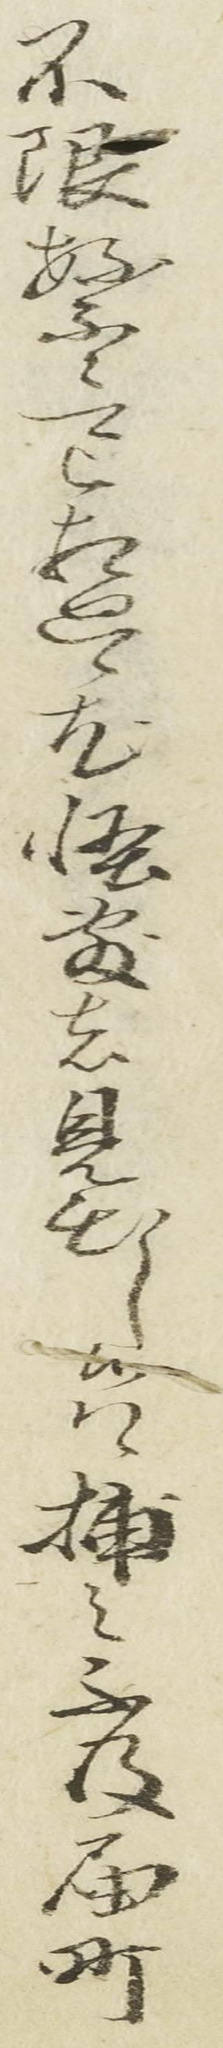不限繁々可被相廻候尤怪敷者見出し候ハゝ捕之不及届町
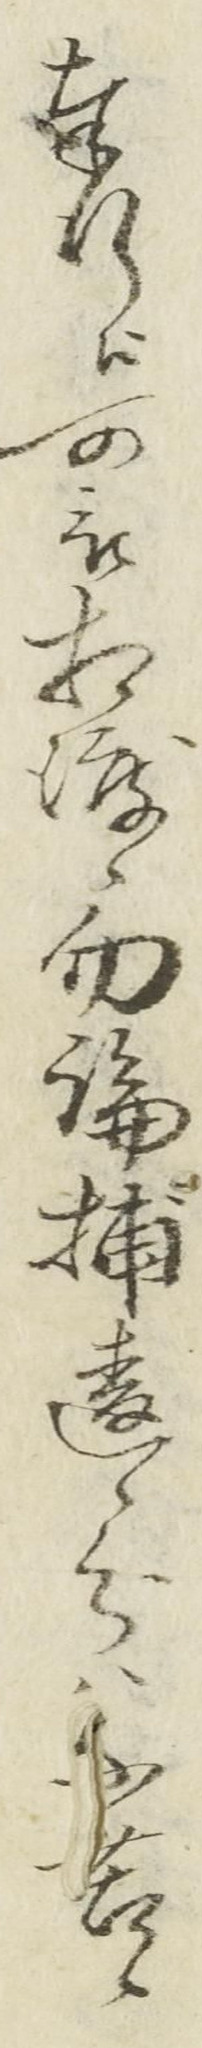え奉行可被相渡候勿論捕違候分ハ不苦候
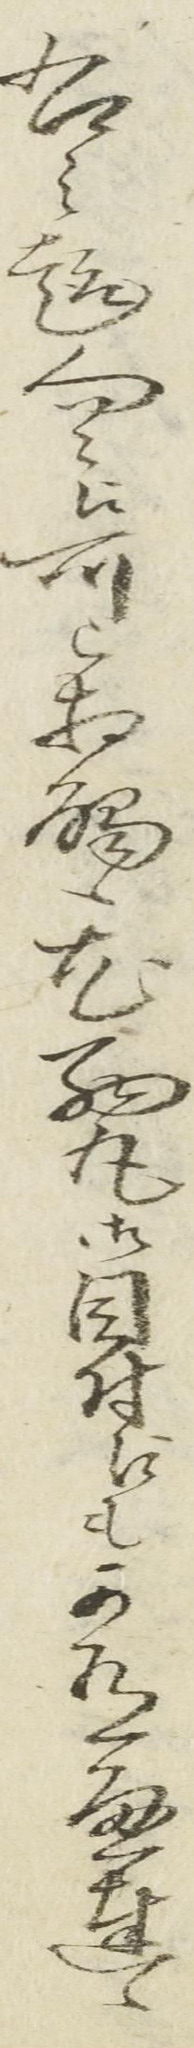右之趣向え可被相触候尤西丸御目付えも可有通達候
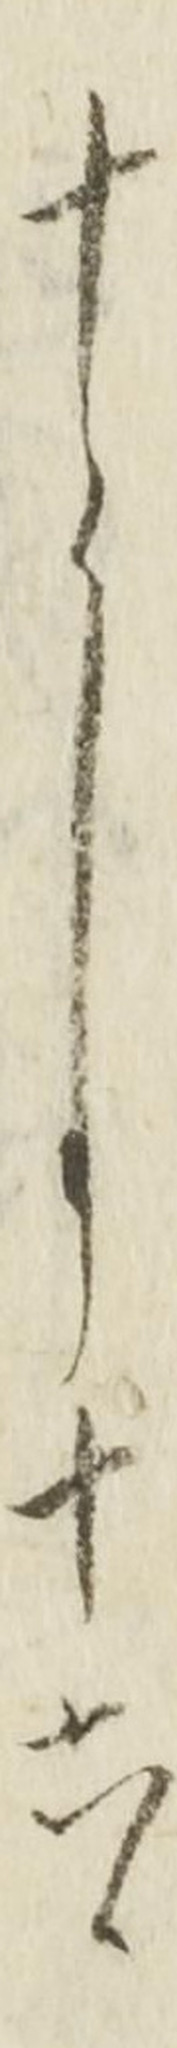十月十六日
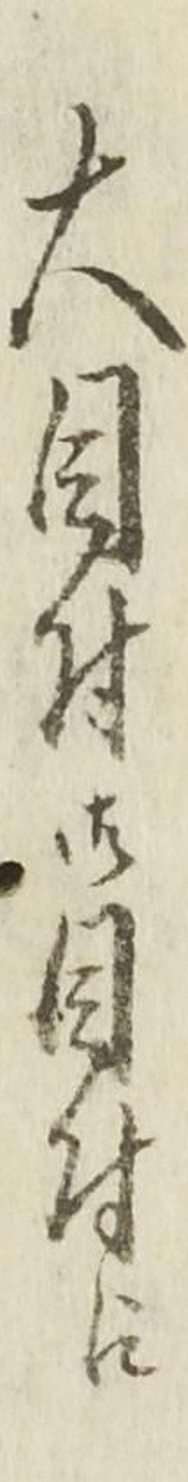大目付御目付え
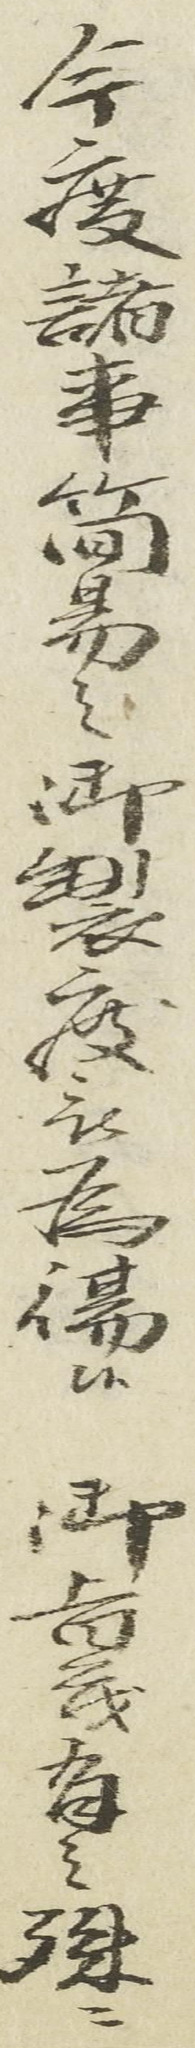今度諸事簡易之御製度被為傷候御旨茂有之殊二
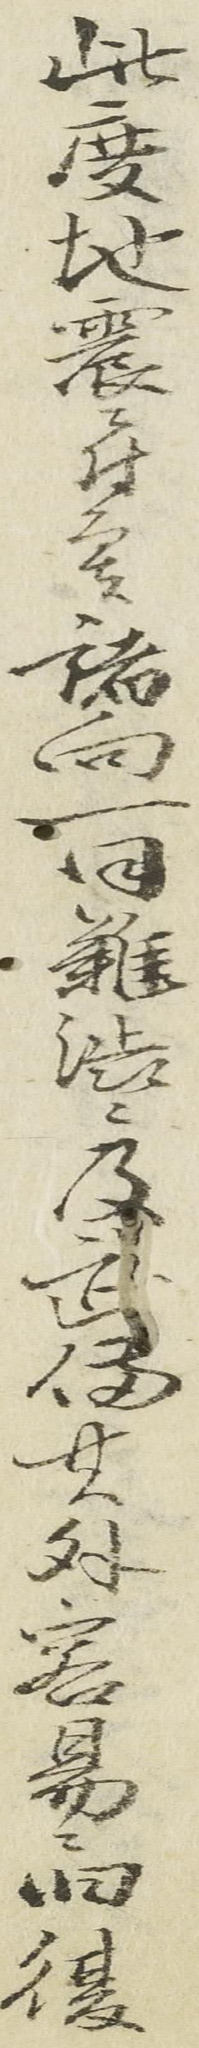此度地震二付而は諸向一同難渋二及武備共外容易二旧復
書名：安政二乙卯年十月二日大地震之事
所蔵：東京大学地震研究所図書室 Earthquake Research Institute Library, The University of Tokyo, JAPAN
